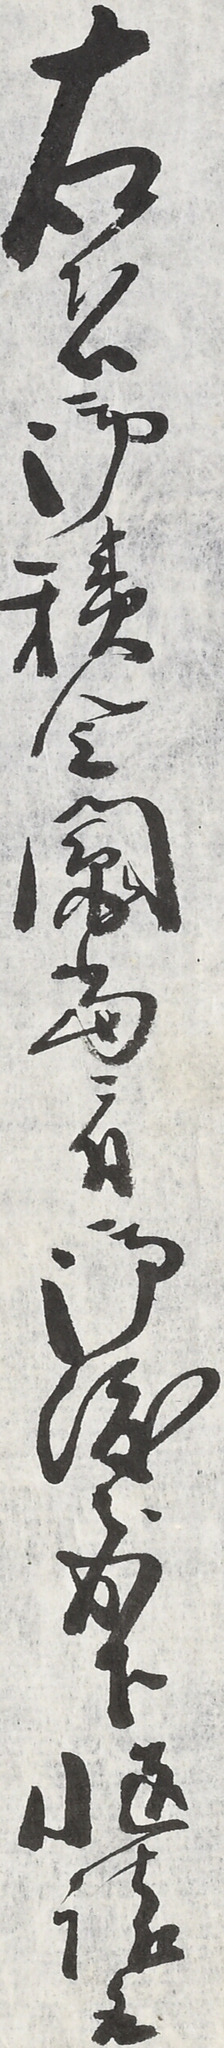右は御積金鬮当ニ付御渡被成下慥請取
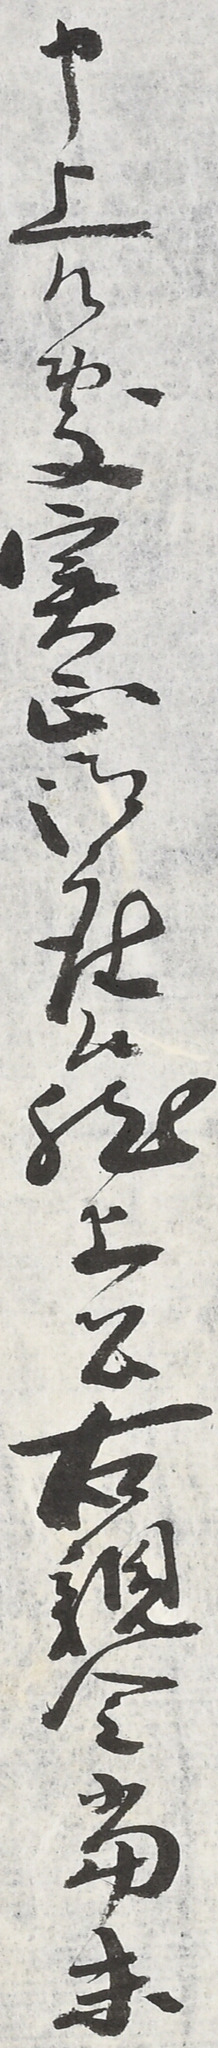申上候処実正御座候然上は右親金当未
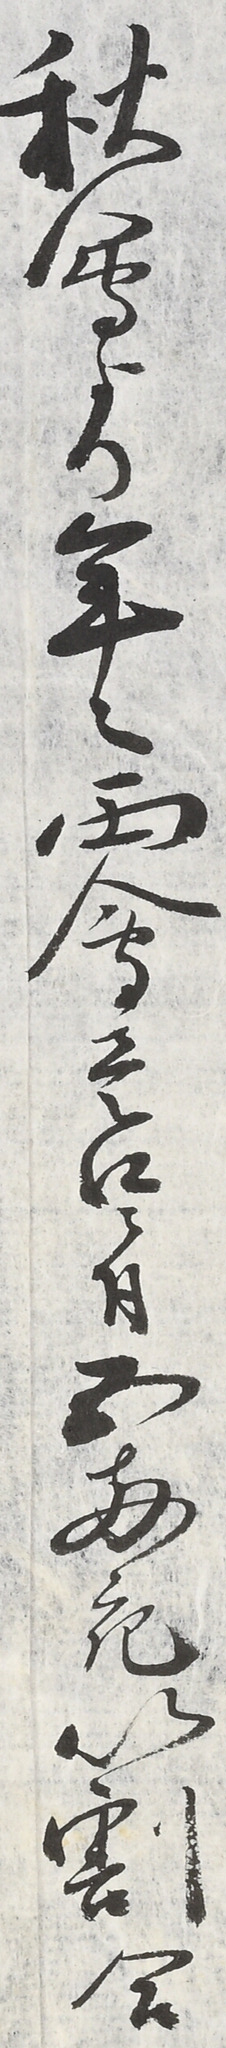秋会より年々両会壱口ニ付五両宛以割合
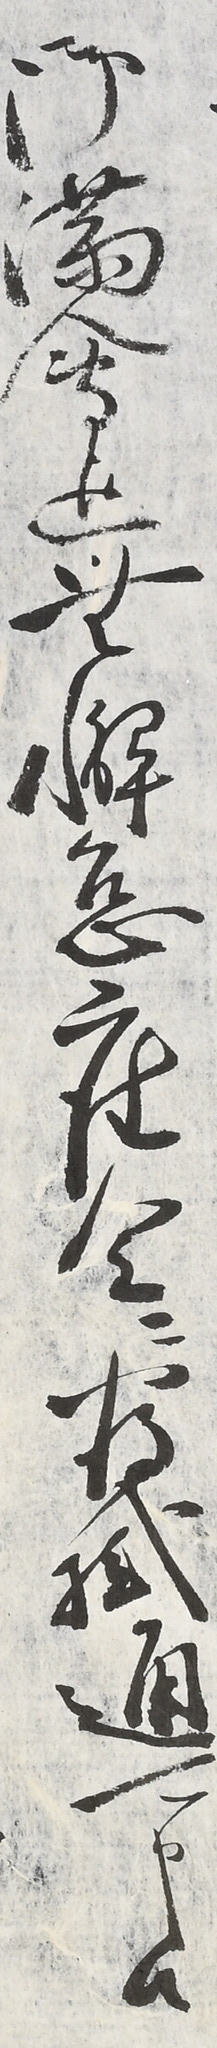御満会迄無懈怠座金ニ為掛通可申候
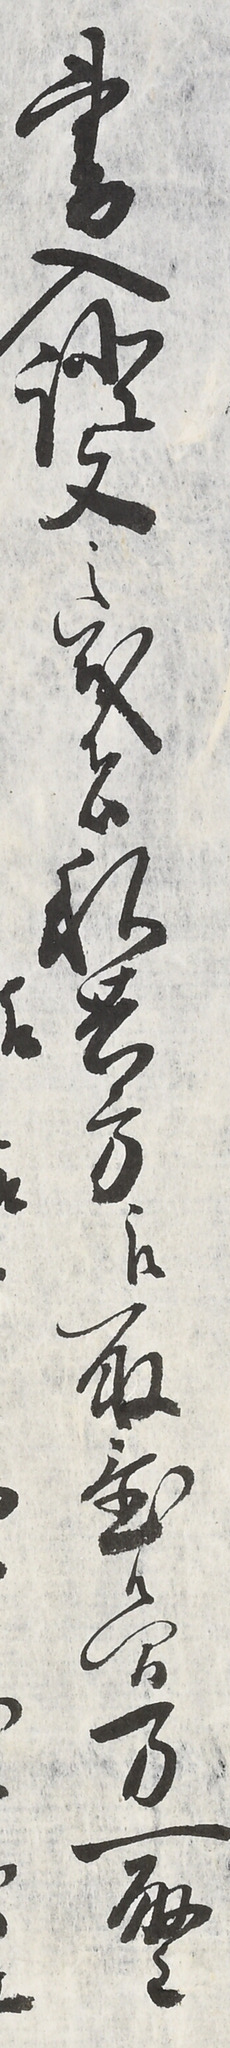書入証文之義は私共方江取置候間万一取主
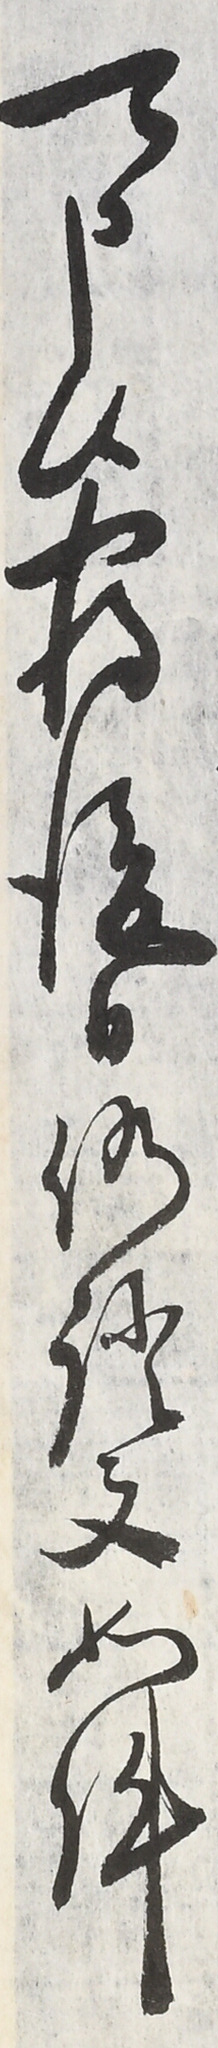可申候為後日仍証文如件
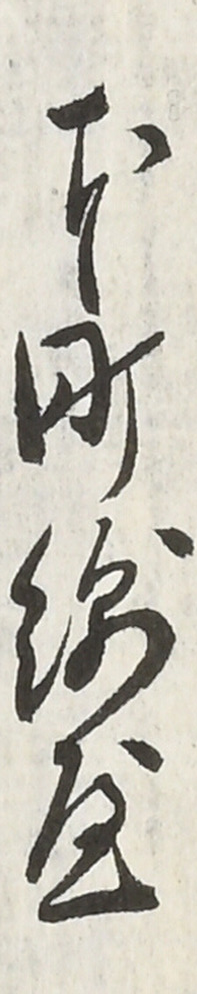本町綿屋
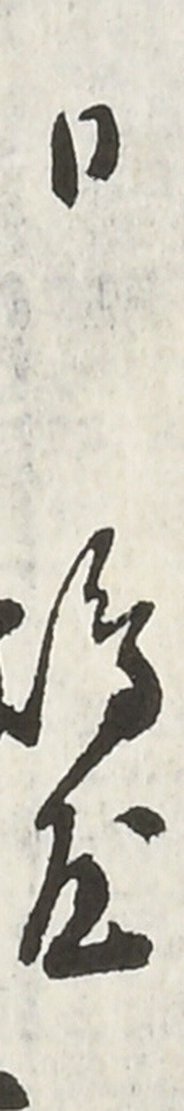同嶋屋
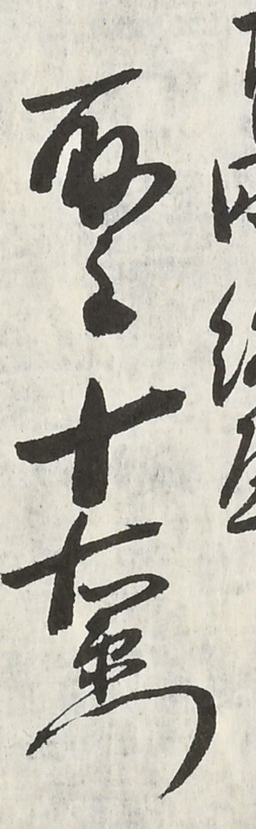取主十右衛門
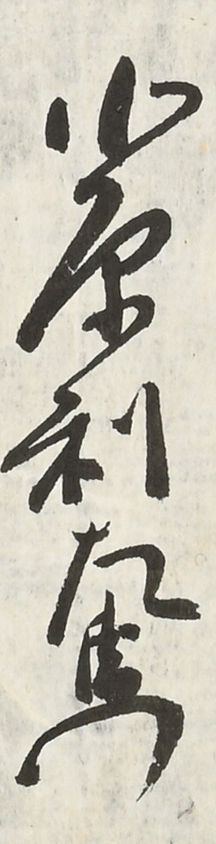北原利左衛門
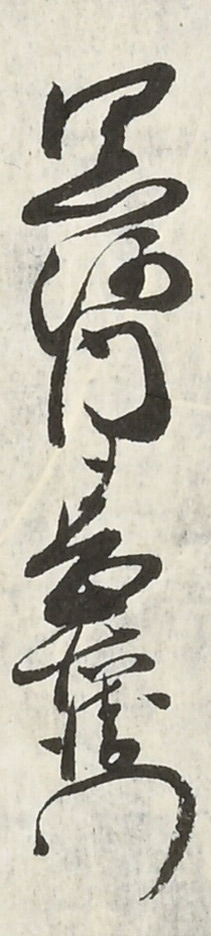黒河内甚右衛門
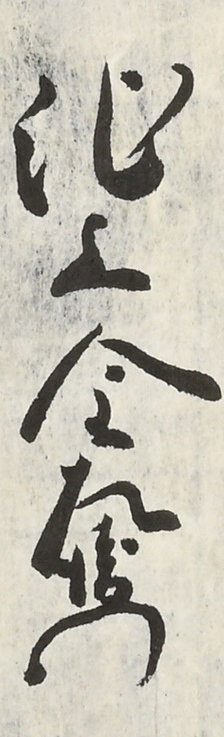池上金左衛門
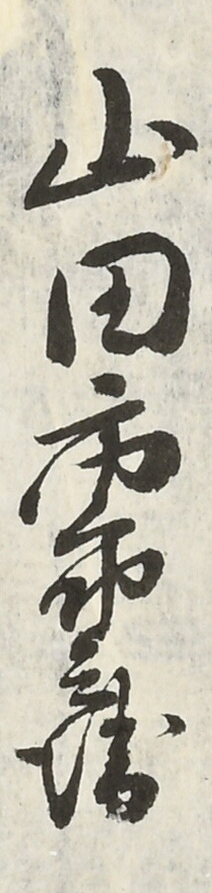山田市郎兵衛
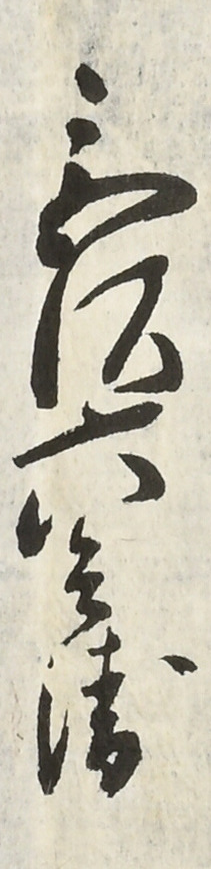宮沢六兵衛
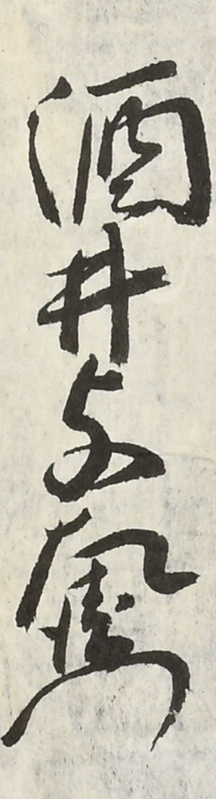酒井与左衛門
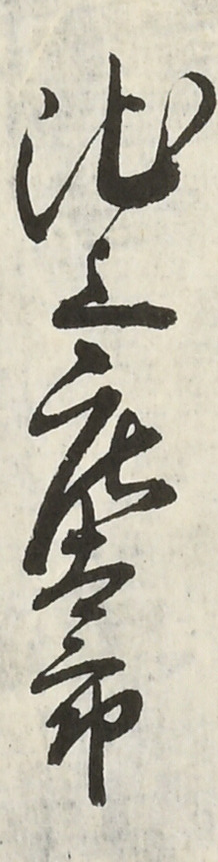池上庄太郎
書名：覚
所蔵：伊那市立高遠町図書館・合同会社AMANE
